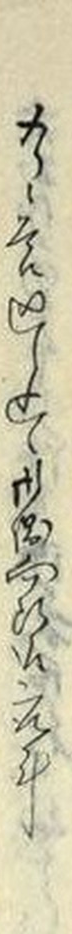〆り候節廻し込候御側向頭取取計
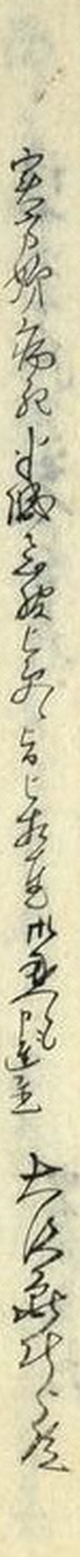実方姉病死半職忌服被受候旨被相達御用人へも申達置大沢亀次郎殿
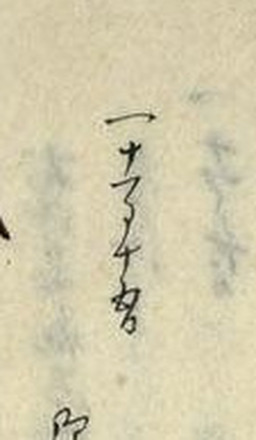一十一月四日
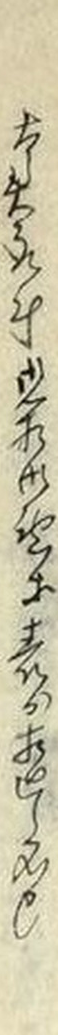大奥取計御箱御台等表ゟ相廻し不申候
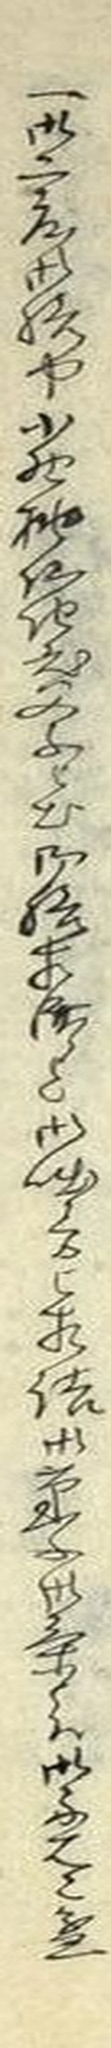一御二度御膳中小野桃仙院老父子被出御膳相済候迄御咄方被相詰御菓子御茶被下御たはこ盆
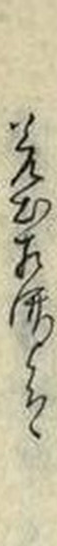差出相済被下候
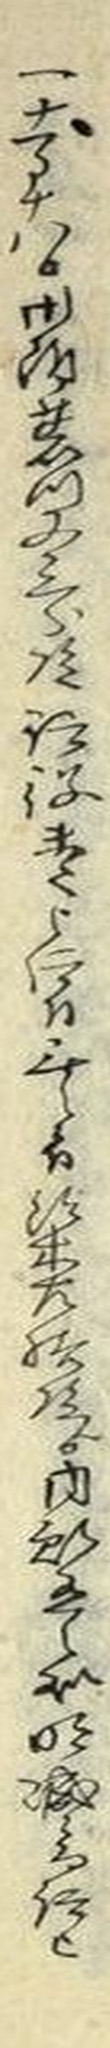一十一月十八日御附荒川又三郎殿跡役未た被仰付無之ニ付鈴木左膳殿ゟ内願有之候処明ニ而跡被

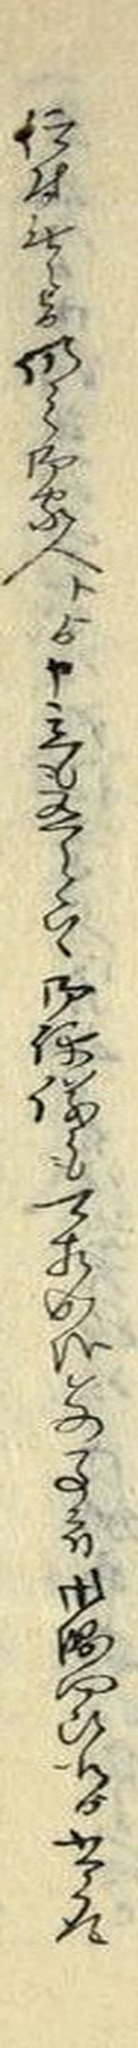仰付無之旨仍之御家人トゟ申立も有之候ハヽ御評議ニも可相成候との事ニ付御側向頭取ゟ書取
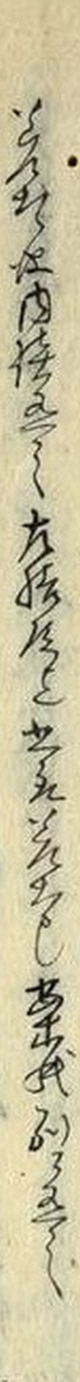差出候儀内談有之左膳殿迄書取差出申候案紙別ニ有之
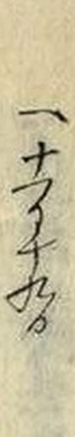一十一月廿九日
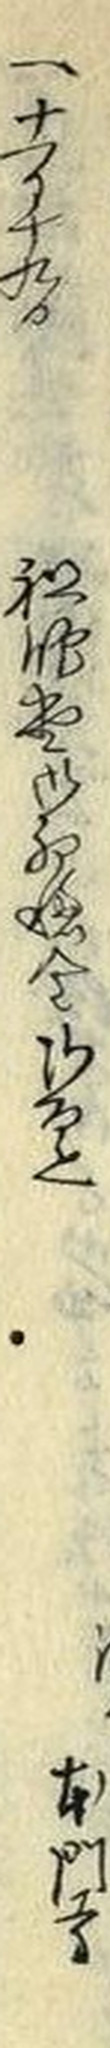一十一月十九日祖師堂御初穂金弐百疋池上本門寺
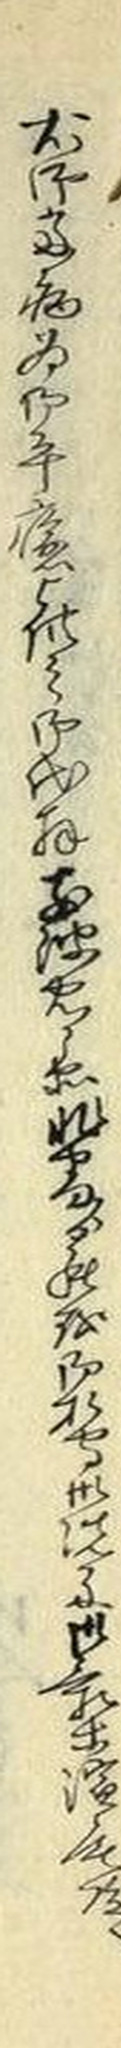右御当病為御平癒被供之御代拝前波忠兵衛非番ゟ罷越御札守御洗米御影等浜尾殿へ
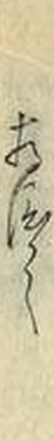相渡之
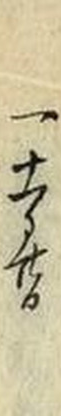一十一月廿九日
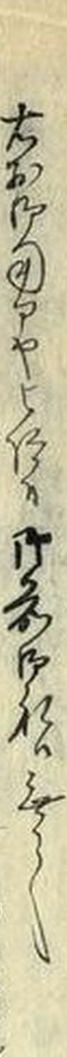右於御用部屋被仰付御前御礼ハ無之
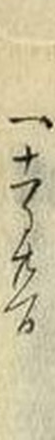一十一月廿九日
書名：少傅日録抄（斉善付側向頭取日記、在府）
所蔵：福井県文書館 Fukui Prefectural Archives
